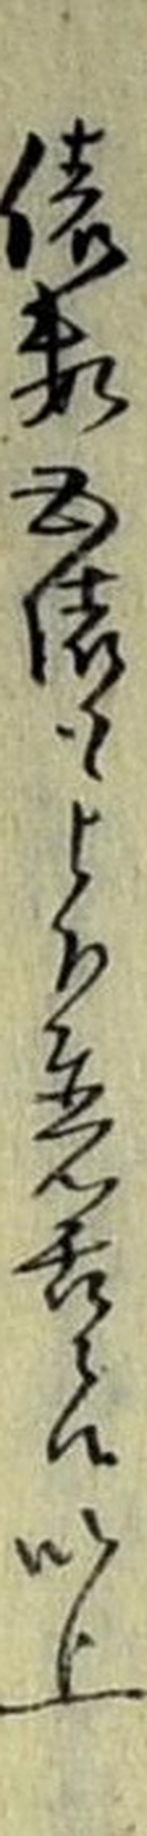俵数五俵ツヽ被下置筈ニ候以上
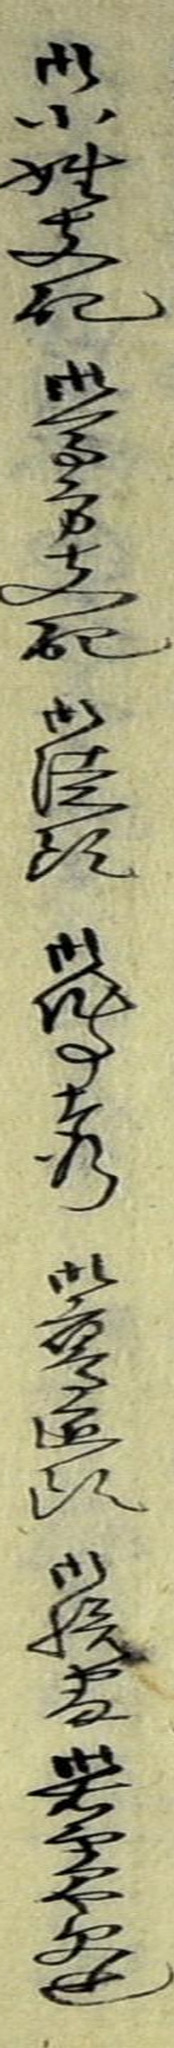御小姓支配御馬方支配御徒頭御作事奉行御鷹匠頭御膳番御右筆部屋受込

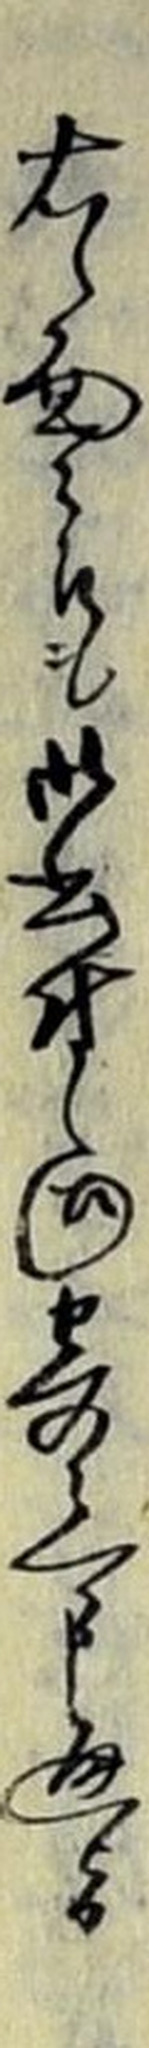右之面々江も御書付之趣寄々可申通旨
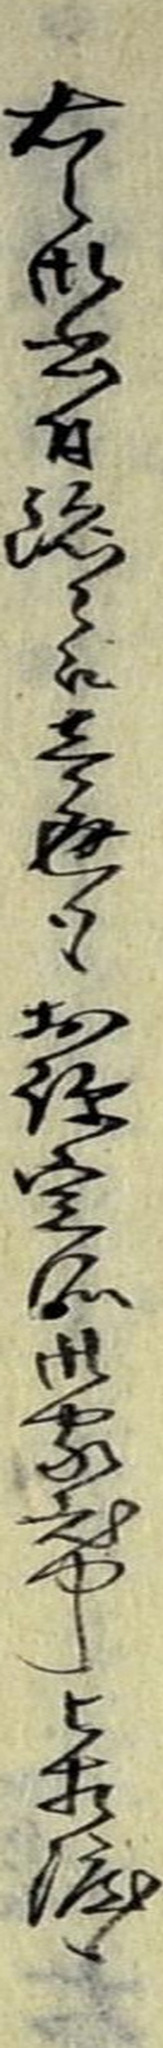右之御書付跡々江壱通ツヽ於評定所御家老中被相渡候
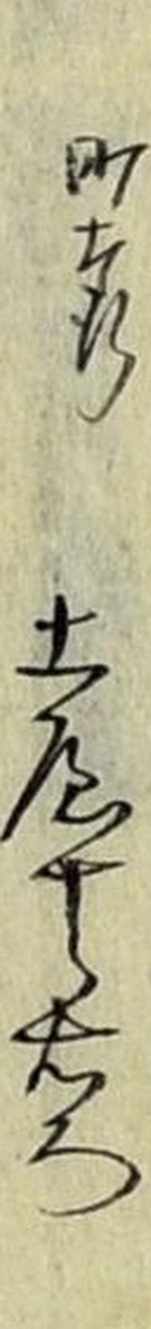町奉行土屋十郎右衛門
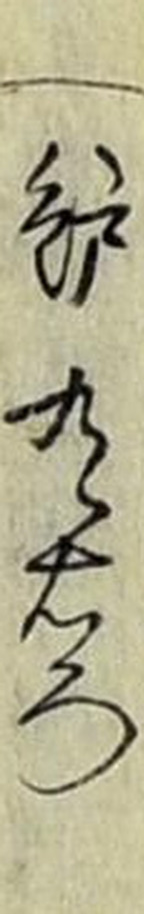鱸九郎右衛門
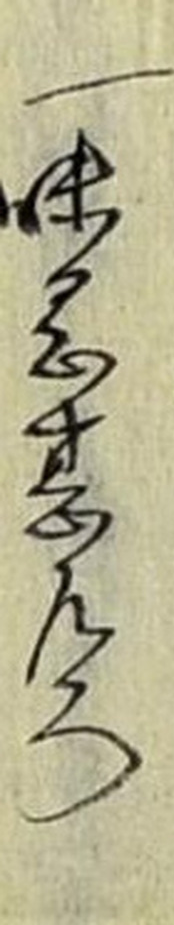味岡甚左衛門
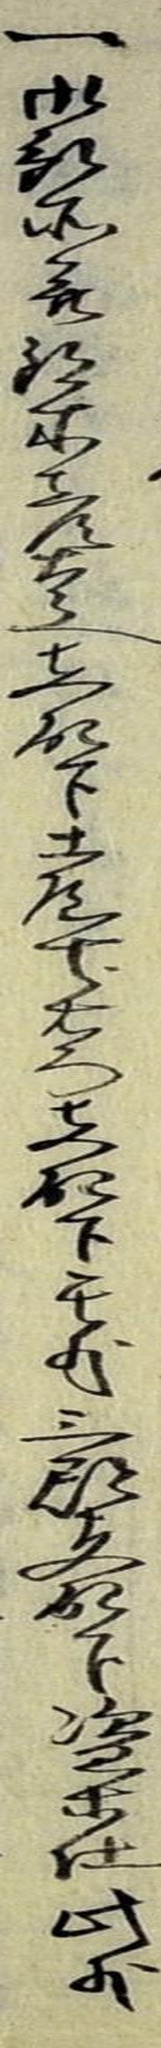一御預所并鈴木彦大夫支配下土屋十郎右衛門支配下其外三郡支配下盗等仕此外
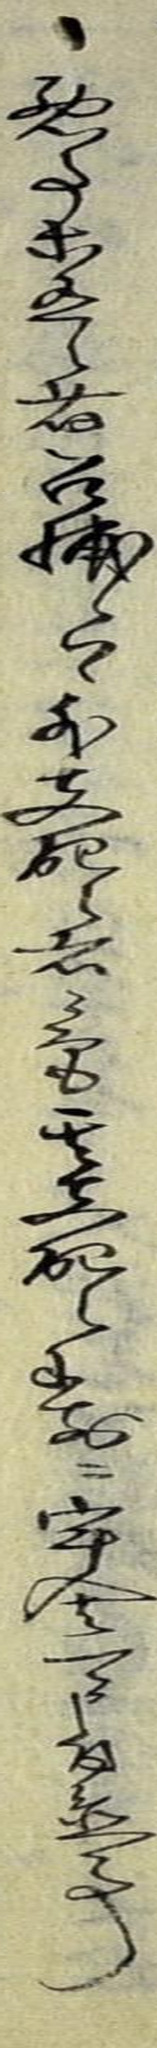悪事等有之者召捕候ハヽ外支配之者ニ候而も其支配之手前ニ牢舎可申付事
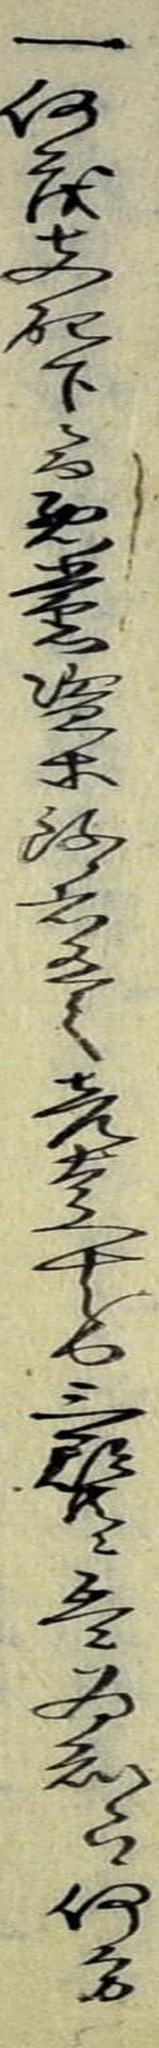一何茂支配下ニ而悪党盗等致候者有之彦大夫十郎右衛門三郡共ニ互ニ為知候ハヽ何方
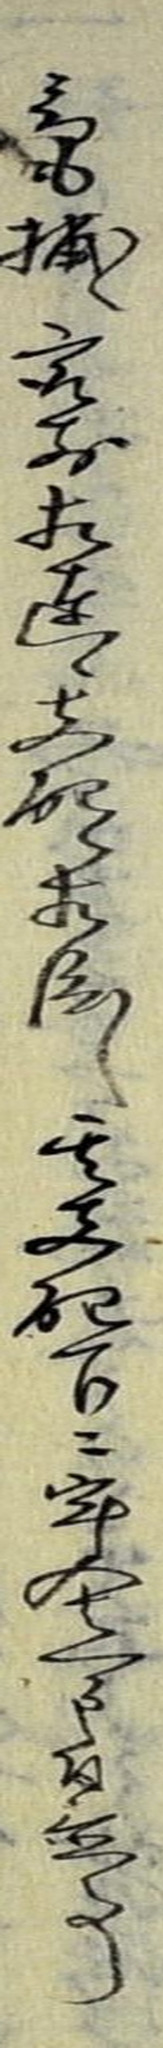ニ而も捕候最前相達候支配へ相渡之其支配下ニ牢舎可申付置事
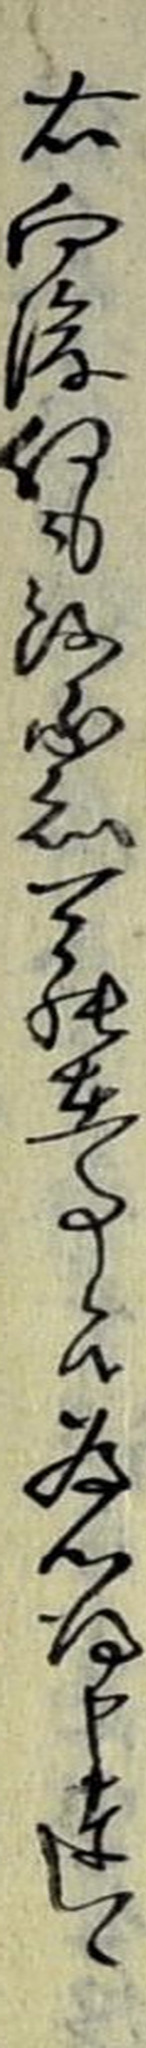右向後何も致承知可罷在事ニ候為心得申達候
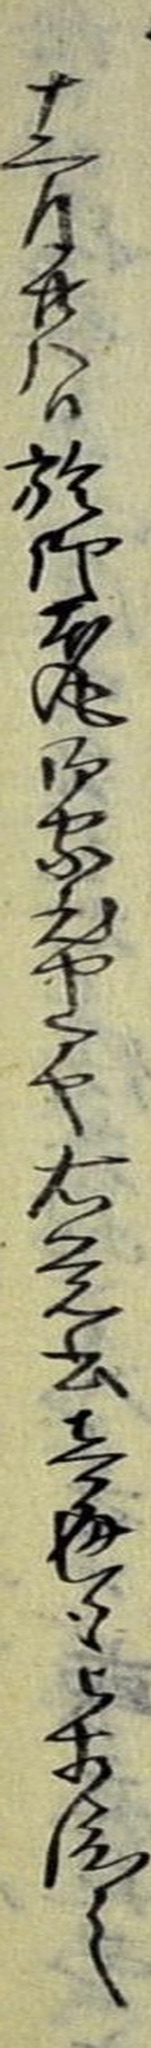十二月廿八日於御本丸御家老中部屋右覚書壱通ツヽ被相渡之
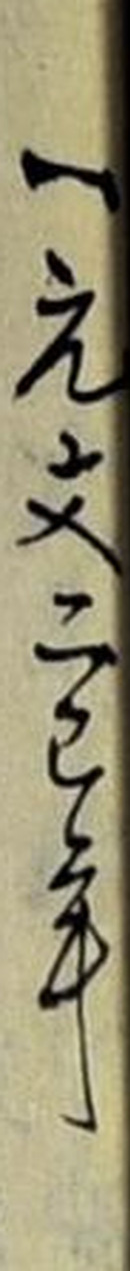一元文二巳年
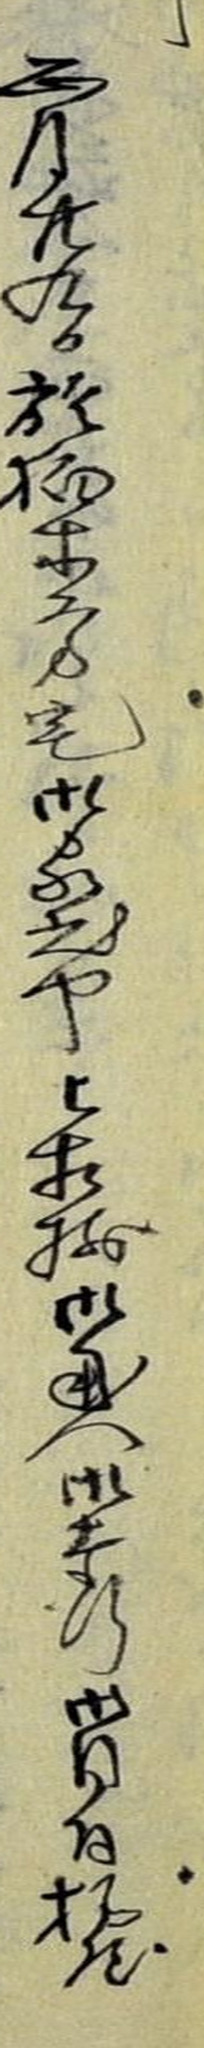正月廿九日於狛木工方宅御家老中被相揃御用人御奉行御目付栃屋
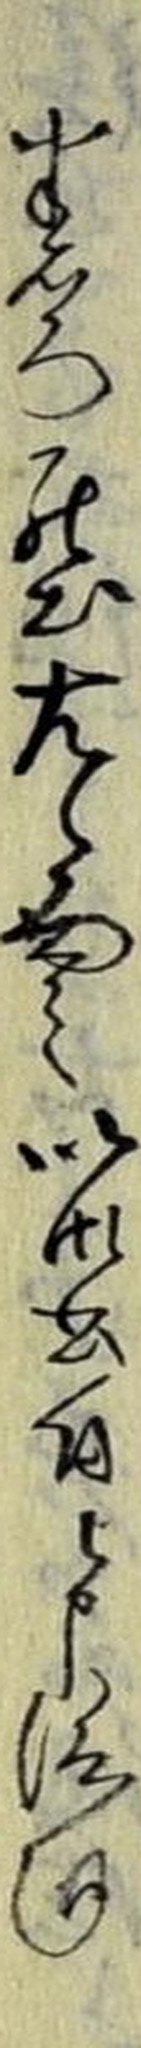半右衛門罷出左之面々へ以御書付被申渡趣
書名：命令之部 一
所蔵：福井県文書館 Fukui Prefectural Archives
